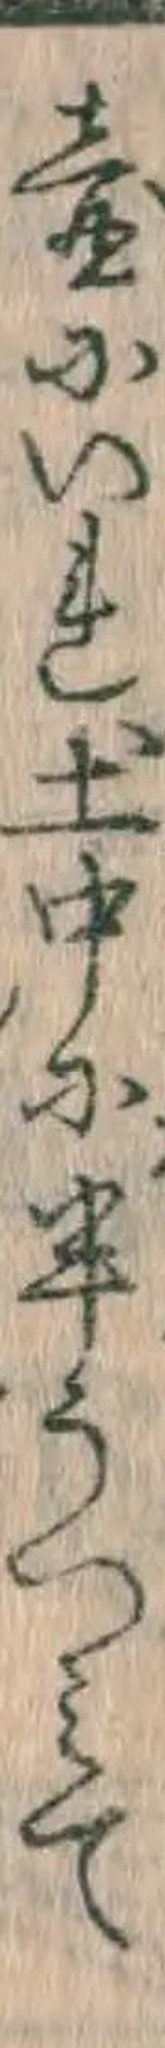壷にいれ土中に半うつみて
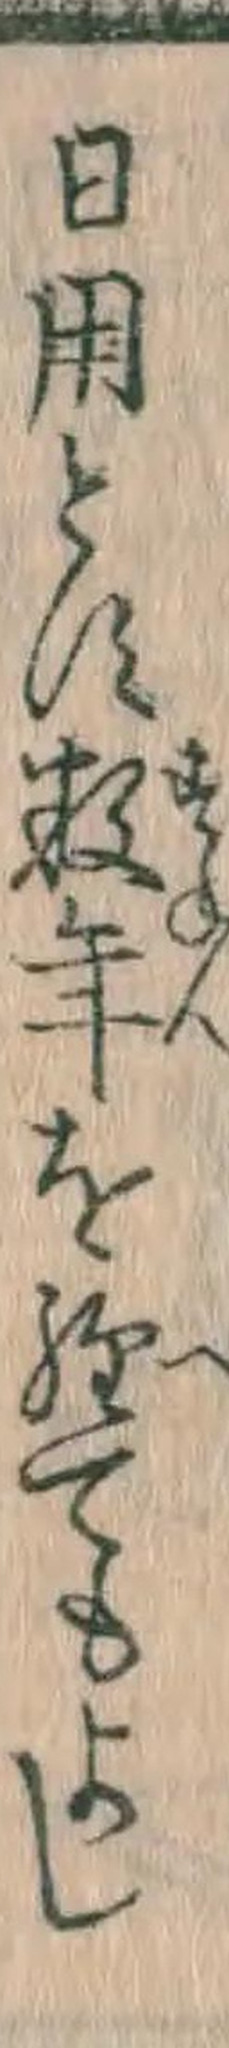日用とす数年を経てもよし
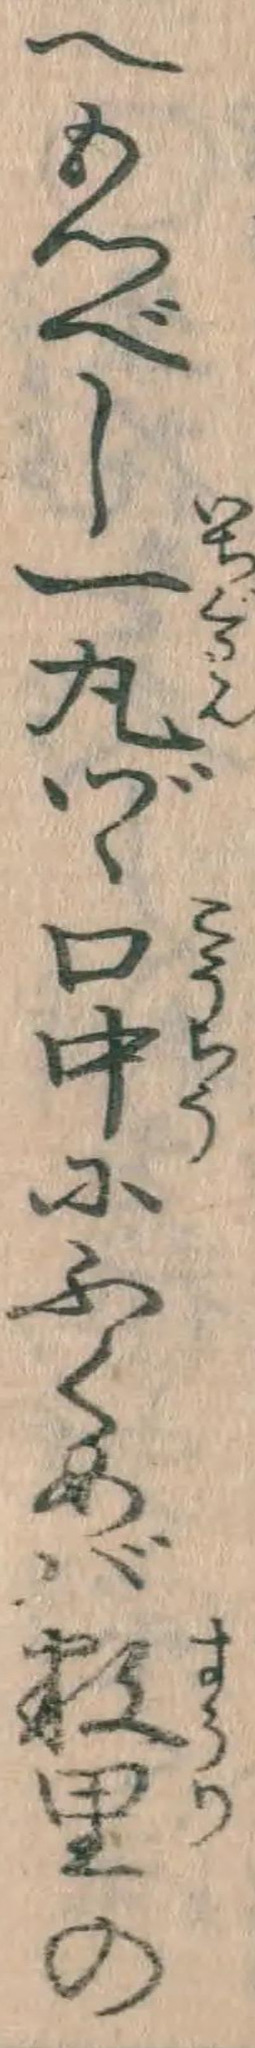へもつべし一丸ヅヽ口中にふくめば数里の
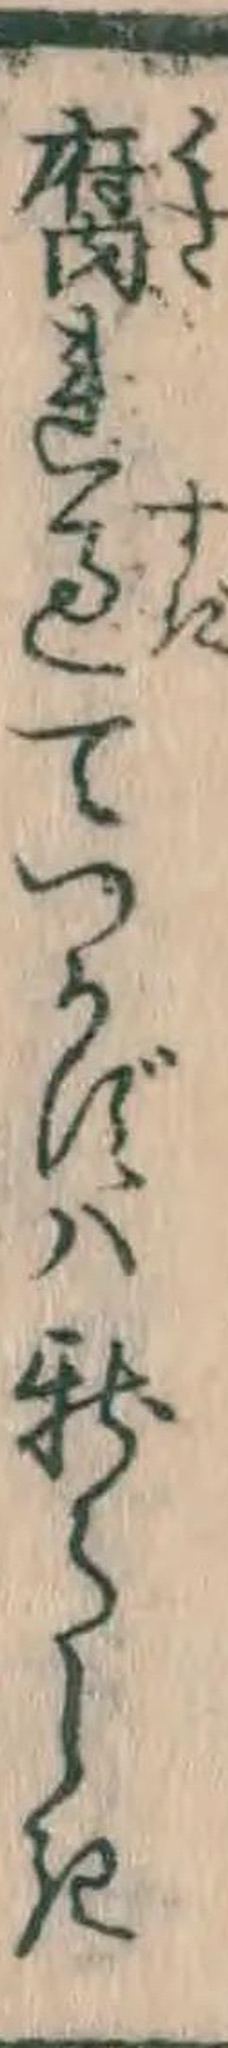腐れ過てつかずは新らしき
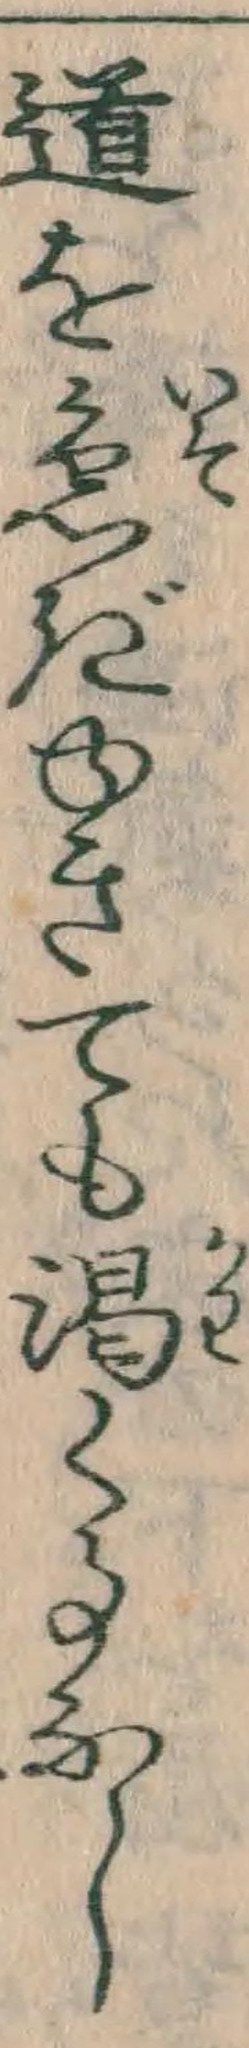道を急ぎゆきても渇く事なし
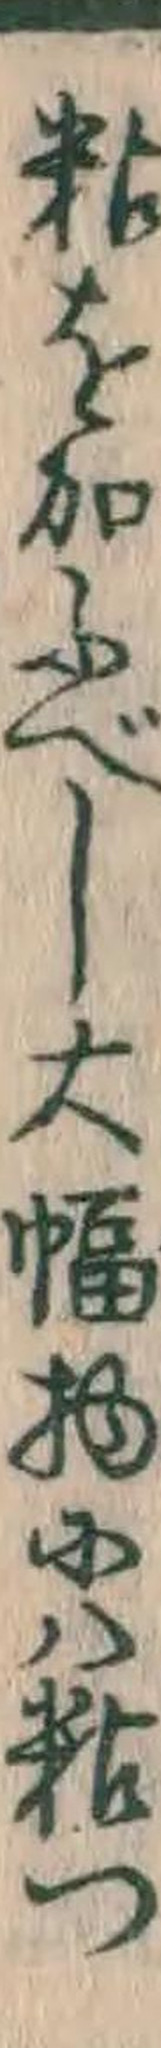粘を加ふべし大幅物には粘つ
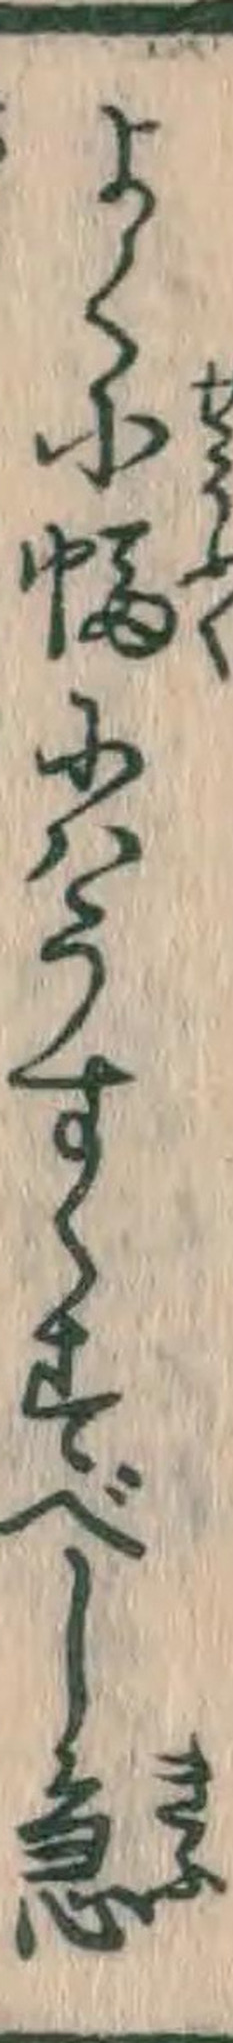よく小幅にはうすくすべし急
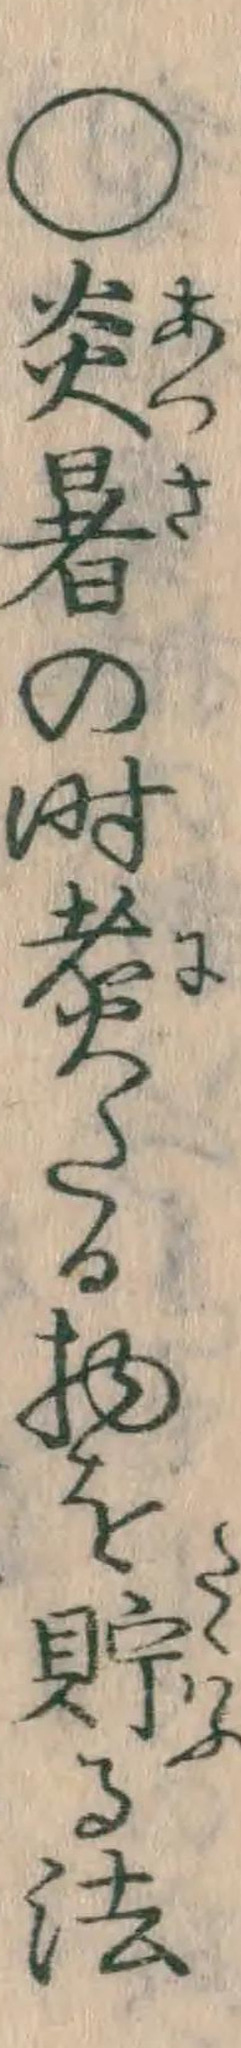○炎暑の時煮たる物を貯る法
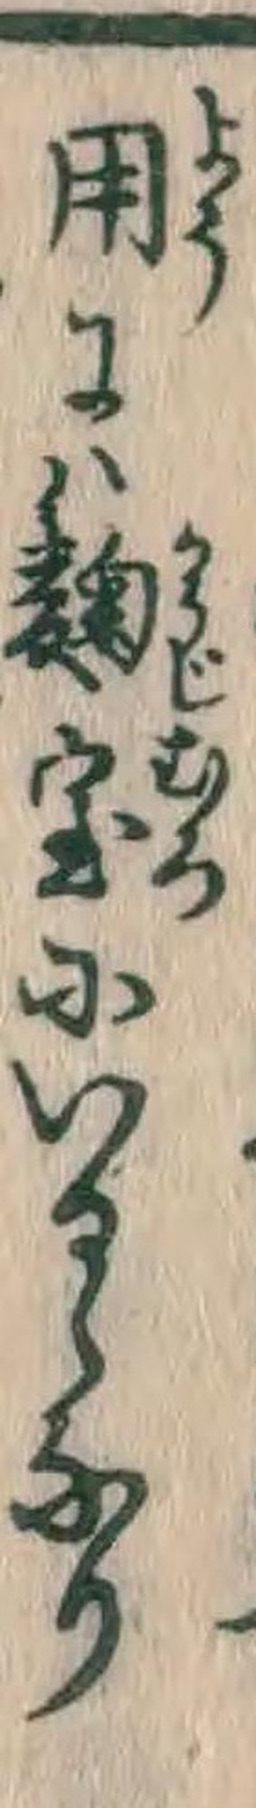用には麹室にいるゝなり
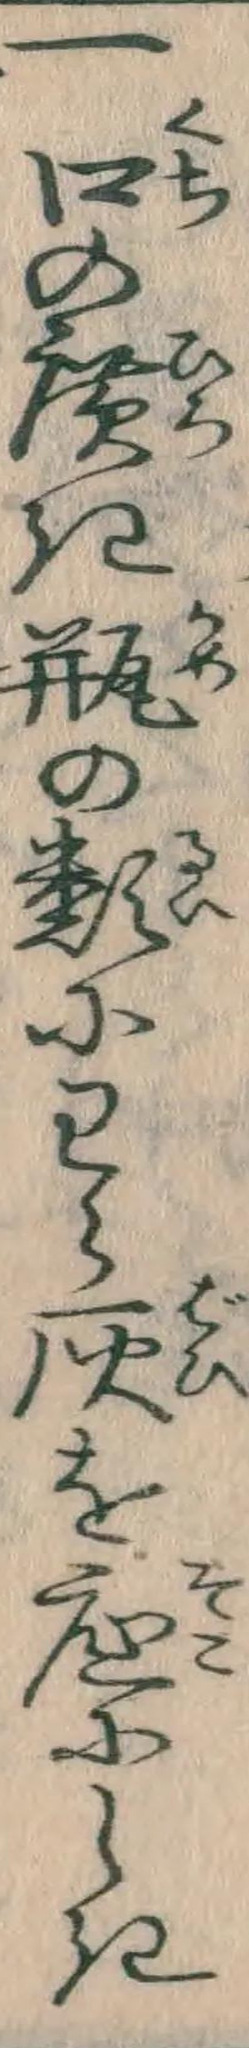一口の広き瓶の類にわら灰を底にしき
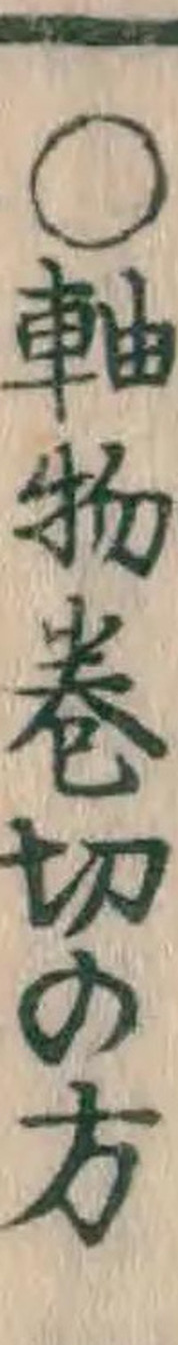○軸物巻切の方
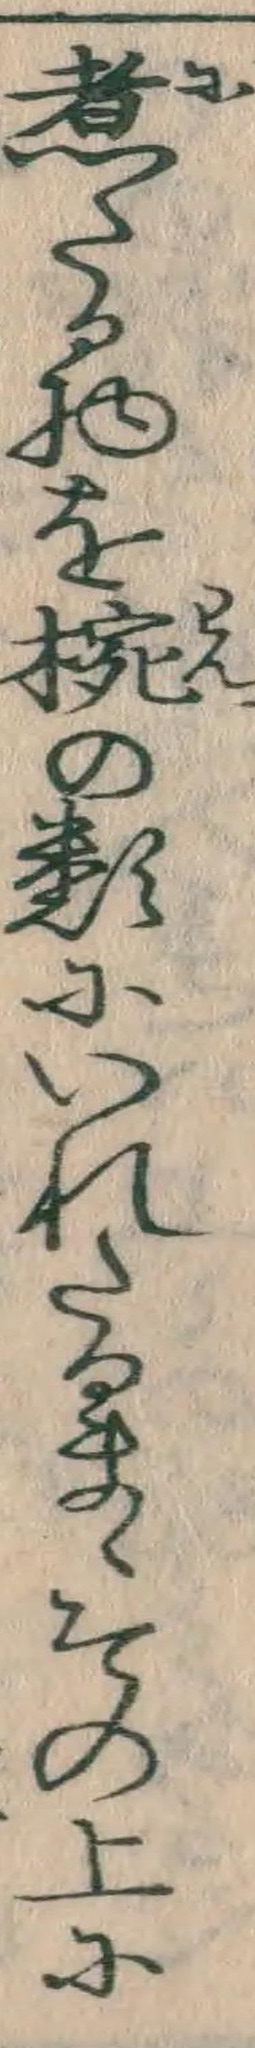煮たる物を椀の類にいれたるまゝその上に
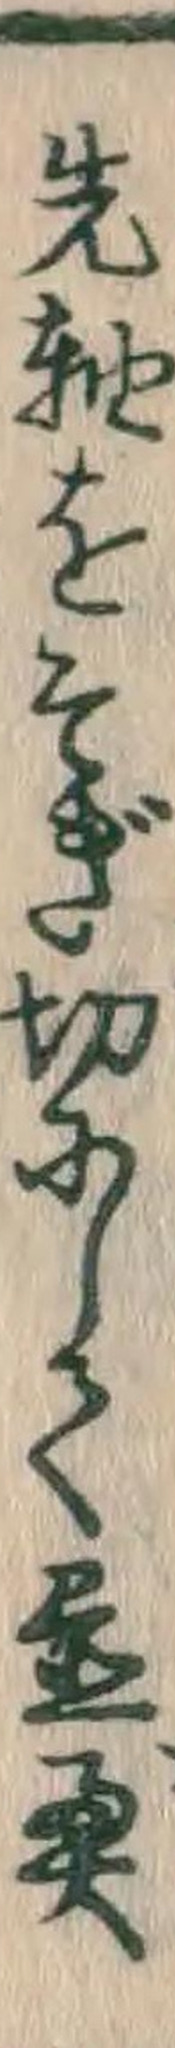先軸をそぎ切にして置奥
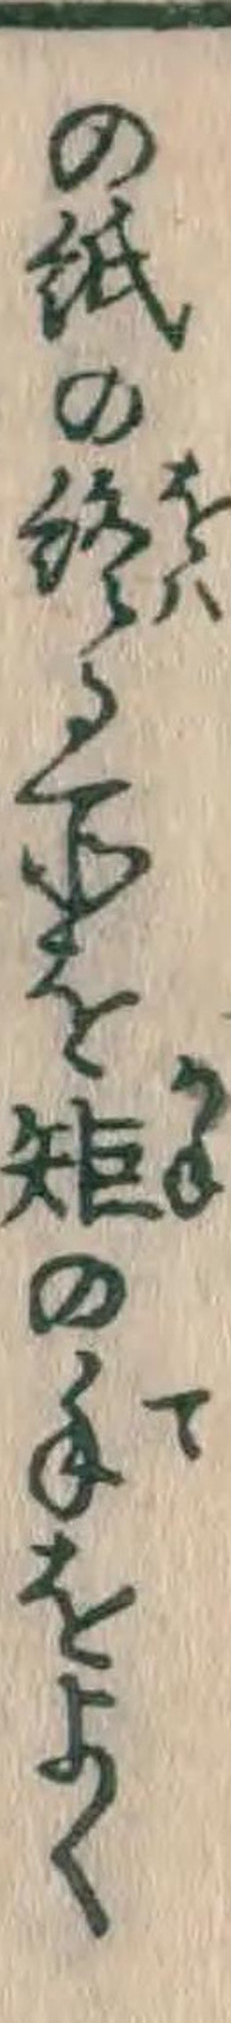の紙の終る所を矩の手をよく
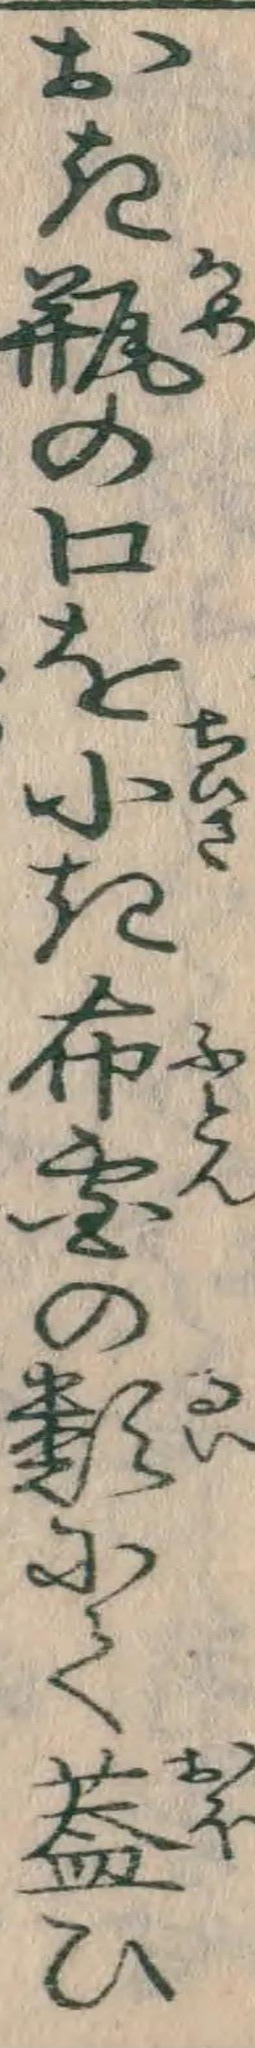おき瓶の口を小き布団の類にて葢ひ
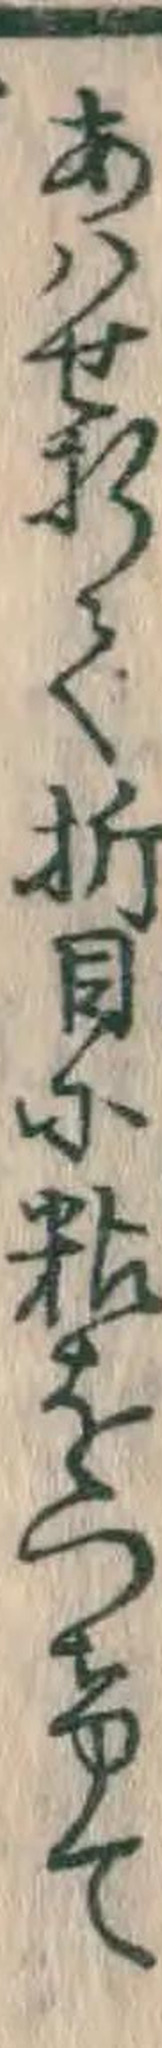あはせ折て折目に粘をつけて
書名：広益秘事大全 3巻. [2]
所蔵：国立国会図書館 National Diet Library, JAPAN
